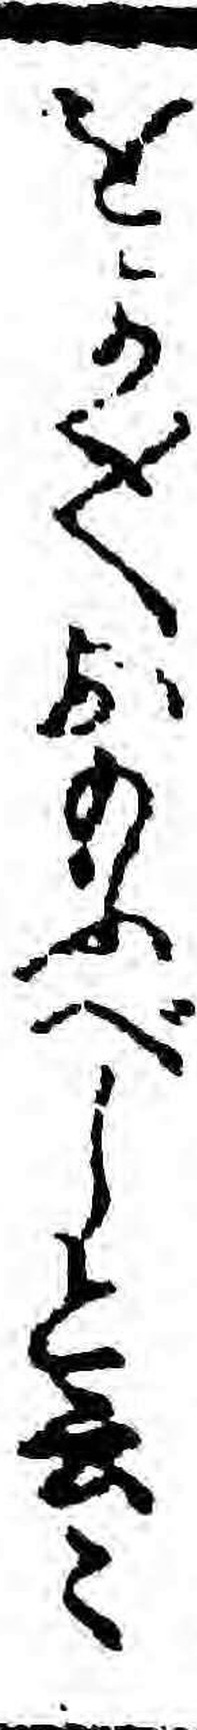をよく〳〵おもふべしと云々
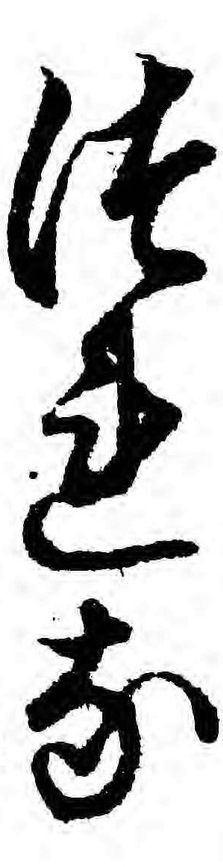つれな
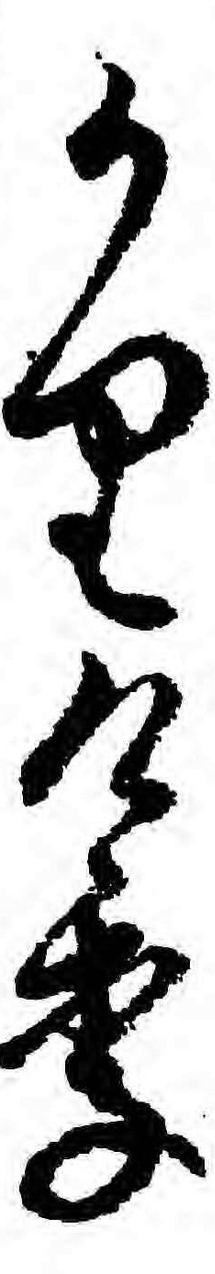かりけり

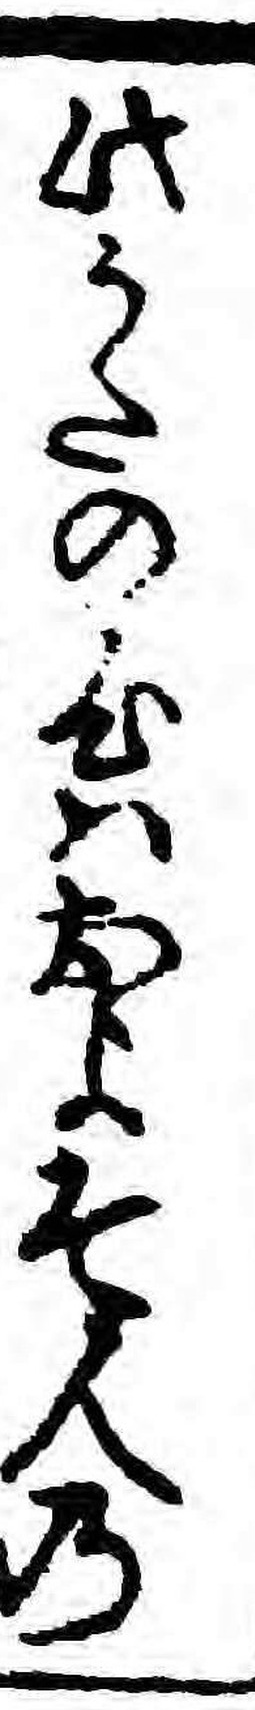此哥の心はおよそ人の
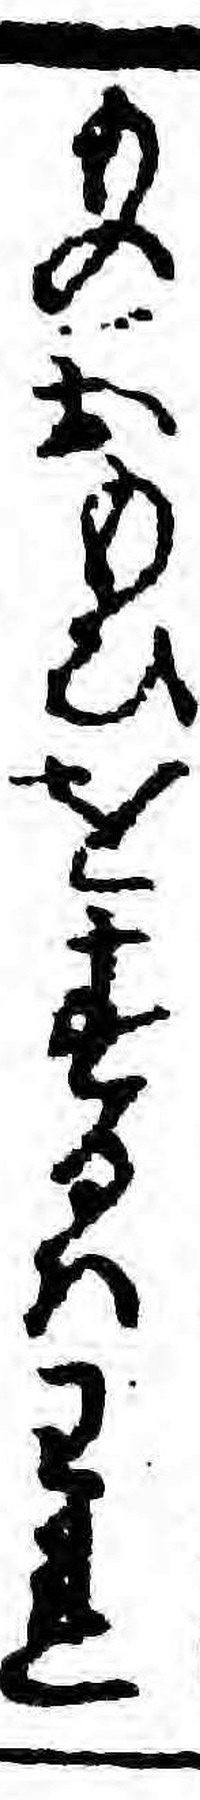ものおもひをするはわれ
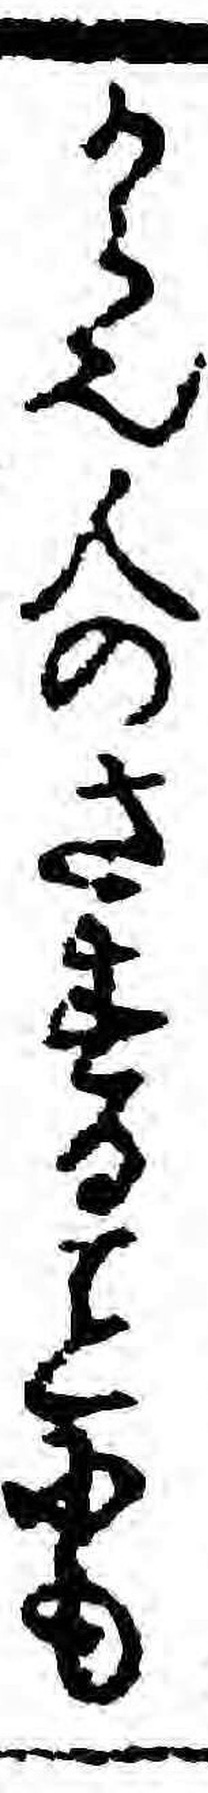から也人のさすることにも
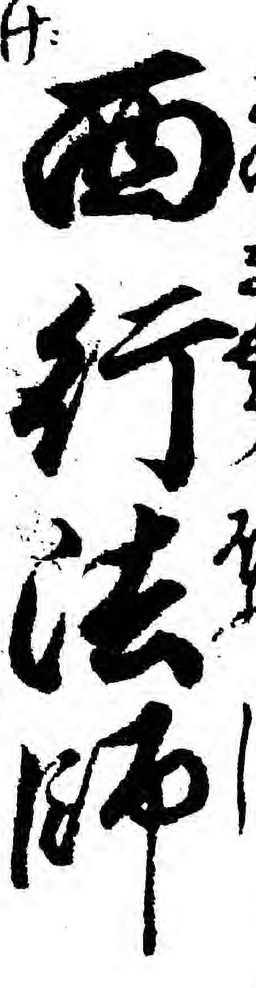西行法師
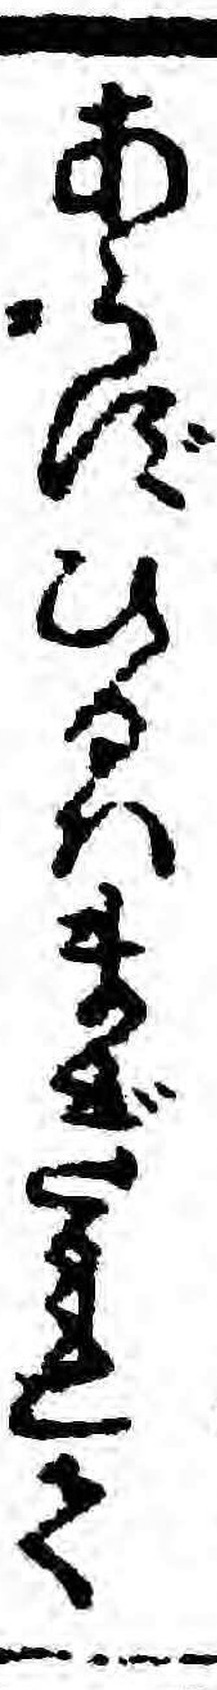あらずひるはまぎれて
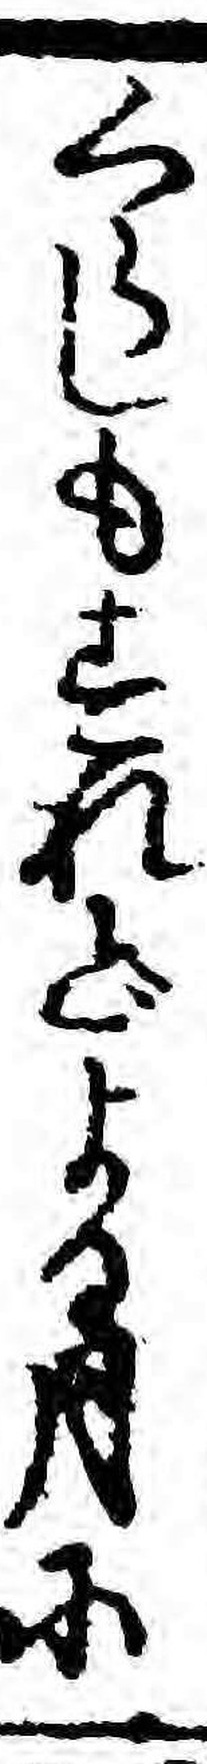くらしもすれどよる月に
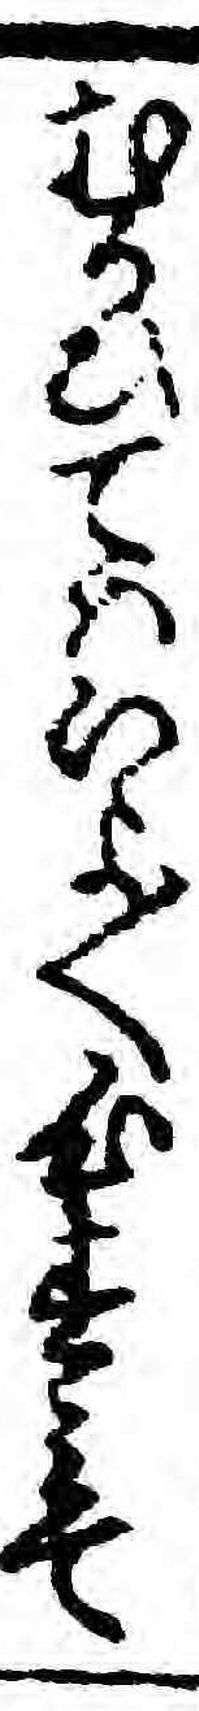むかひてはいよ〳〵心すみて
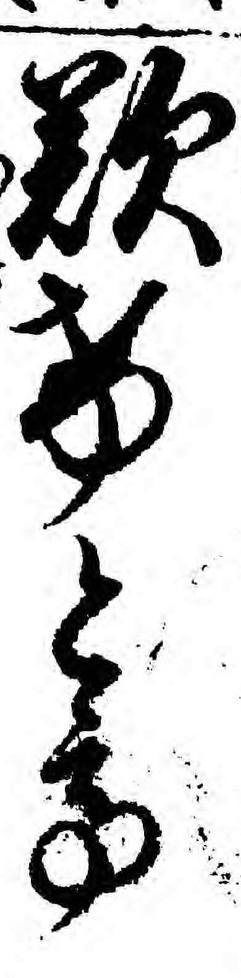歎けとて
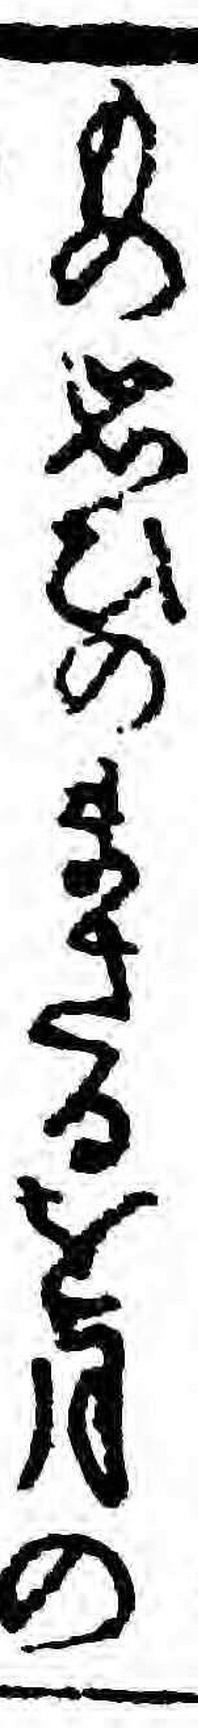もの思ひのまさるを月の
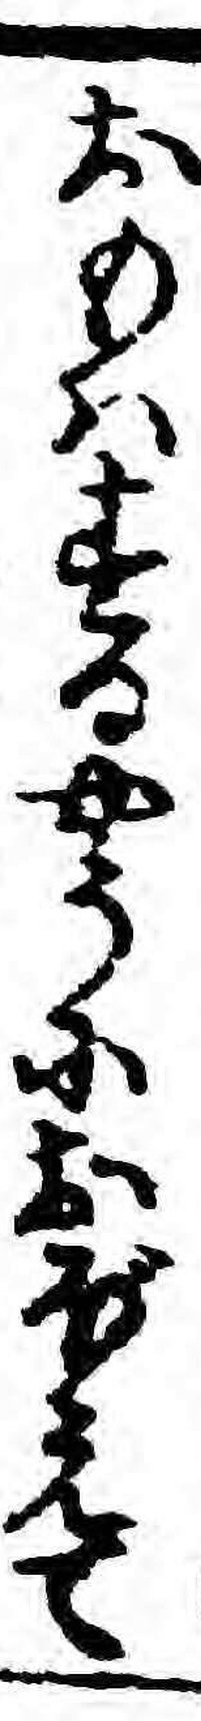おもはするやうにおぼえて
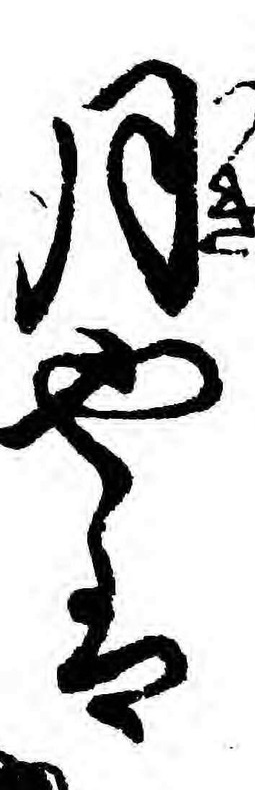月やは
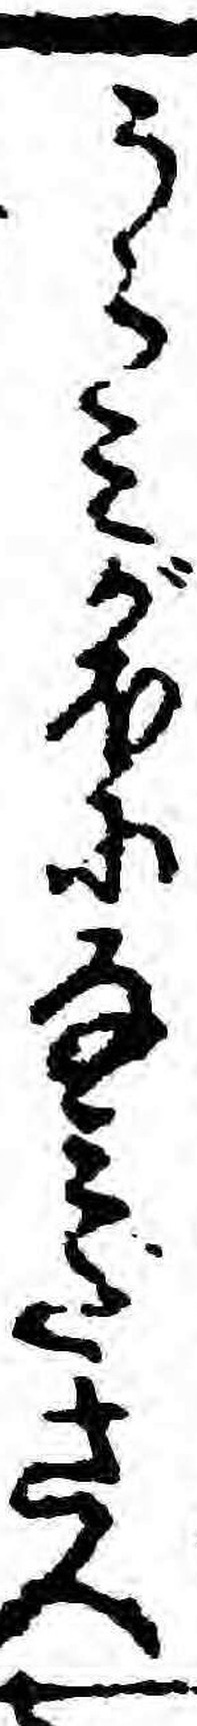うらみがほになみださへ
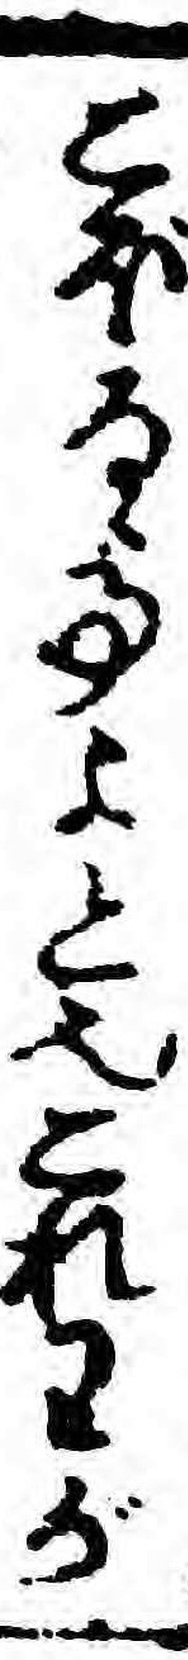こぼるゝ事よと也これわが
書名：頭書和歌注譯／壽賀多百人一首小倉錦
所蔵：国文学研究資料館
